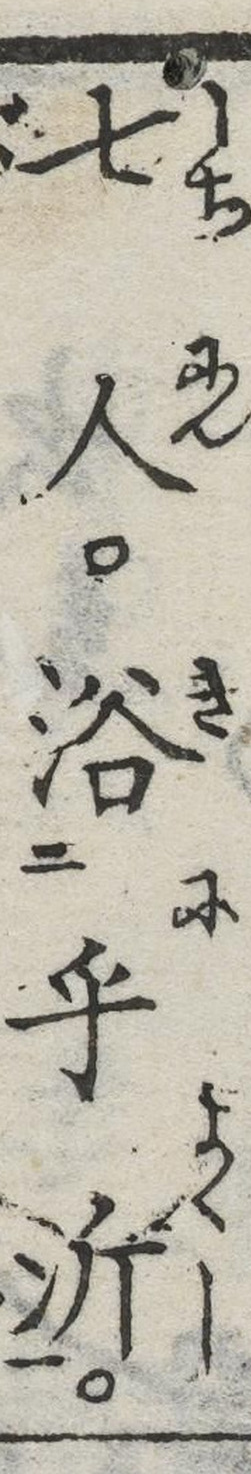七人。浴乎沂。
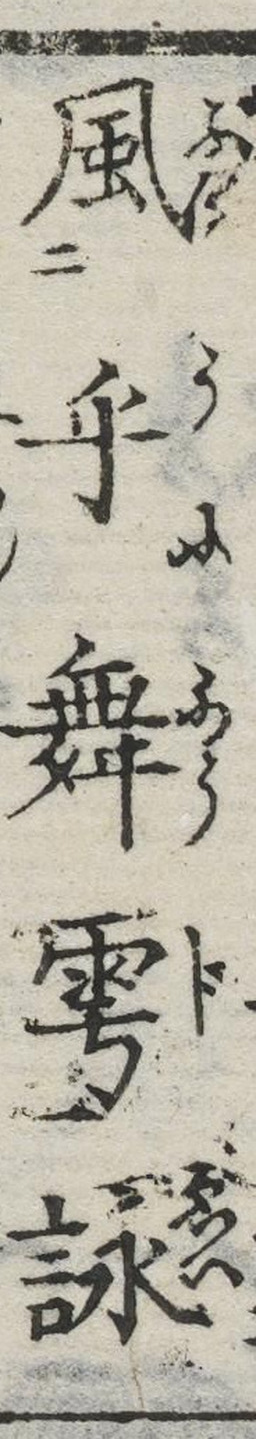風乎舞雩詠
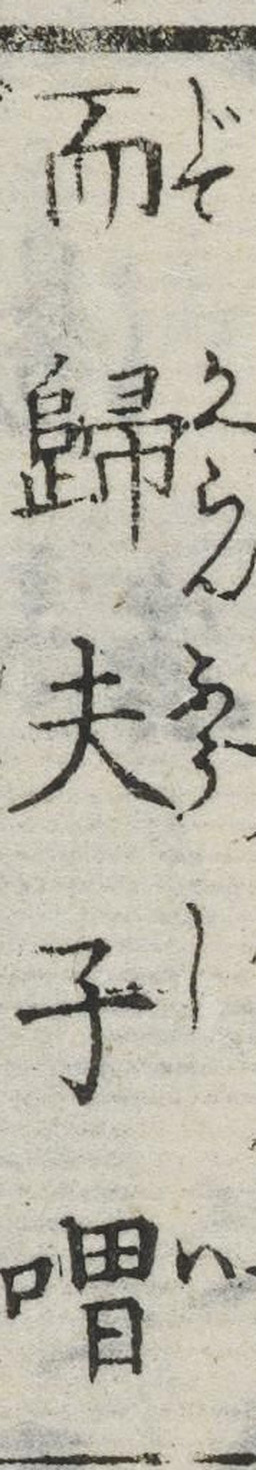而帰夫子喟
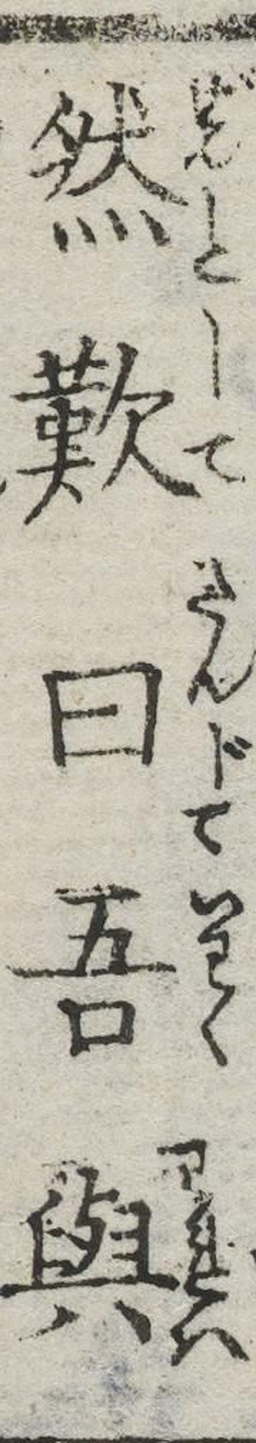然嘆曰吾与

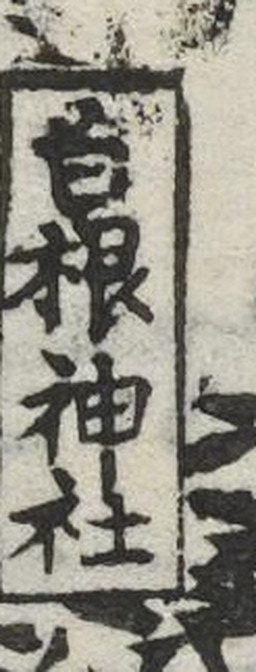白根神社
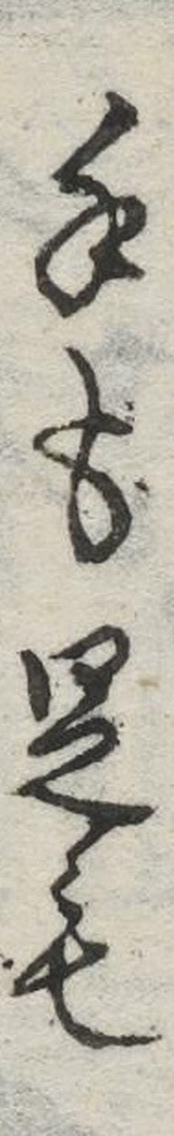手も足も
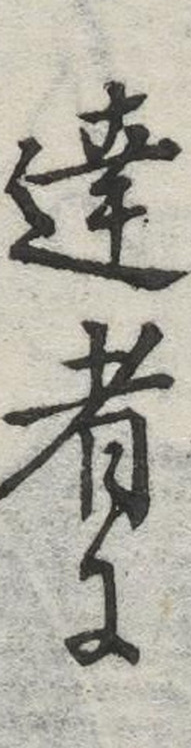達者に
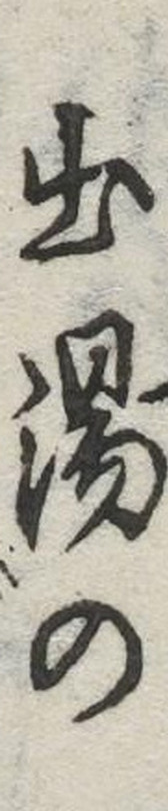出湯の
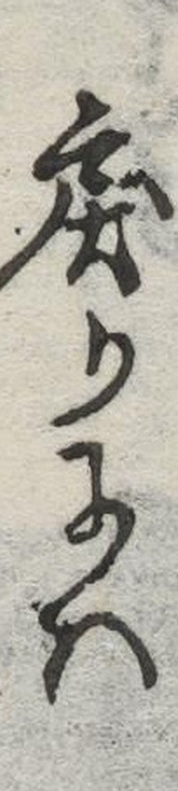戻りには
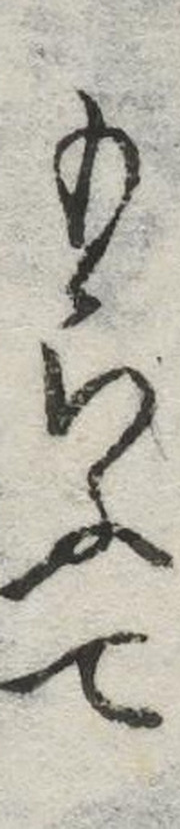もらふて

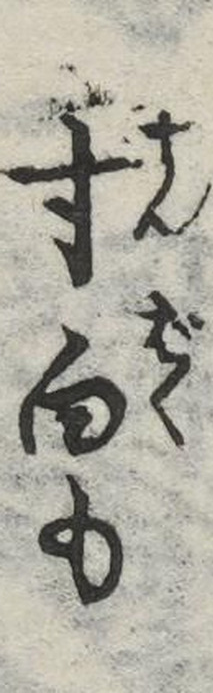寸白も
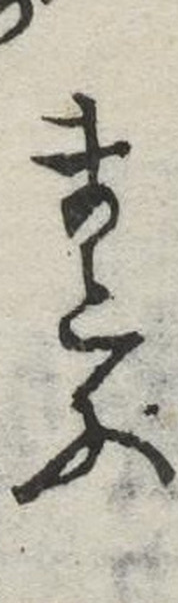まとふ
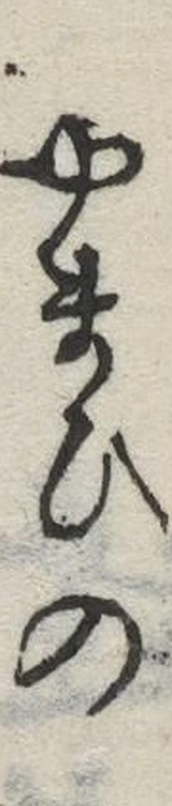やまひの
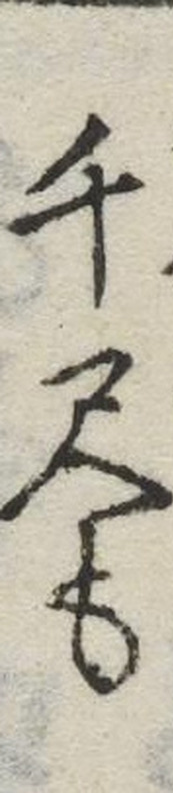千尺も
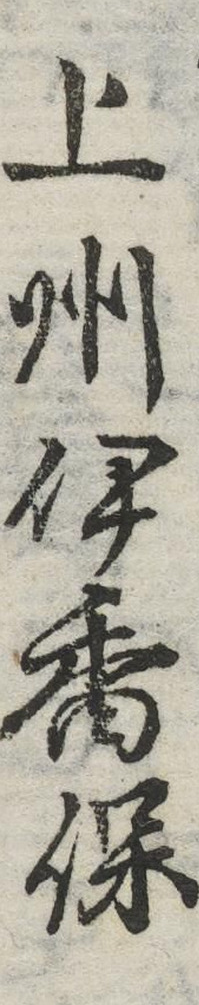上州伊香保
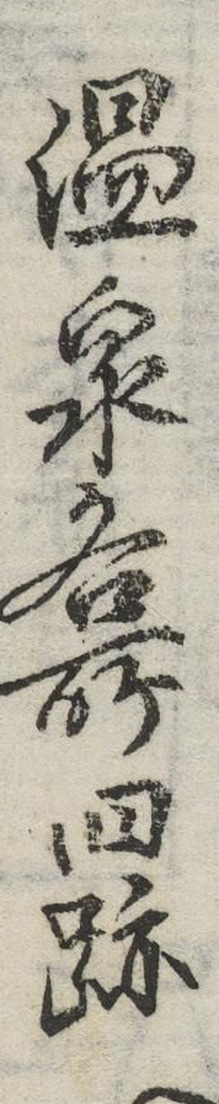温泉各所四跡
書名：諸國温泉遊覽記　全
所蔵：東京大学地震研究所図書室 Earthquake Research Institute Library, The University of Tokyo, JAPAN
